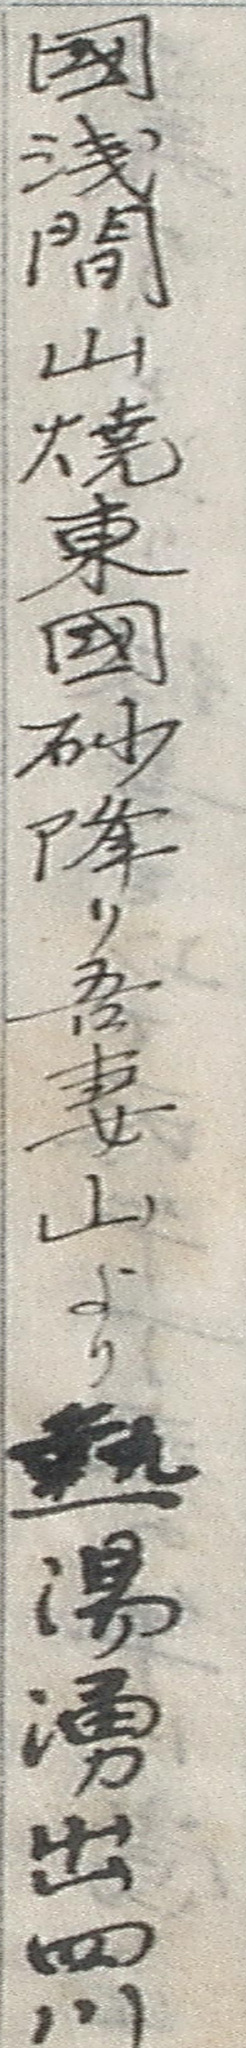国浅間山焼東国砂降り吾妻山より熱湯湧出四川
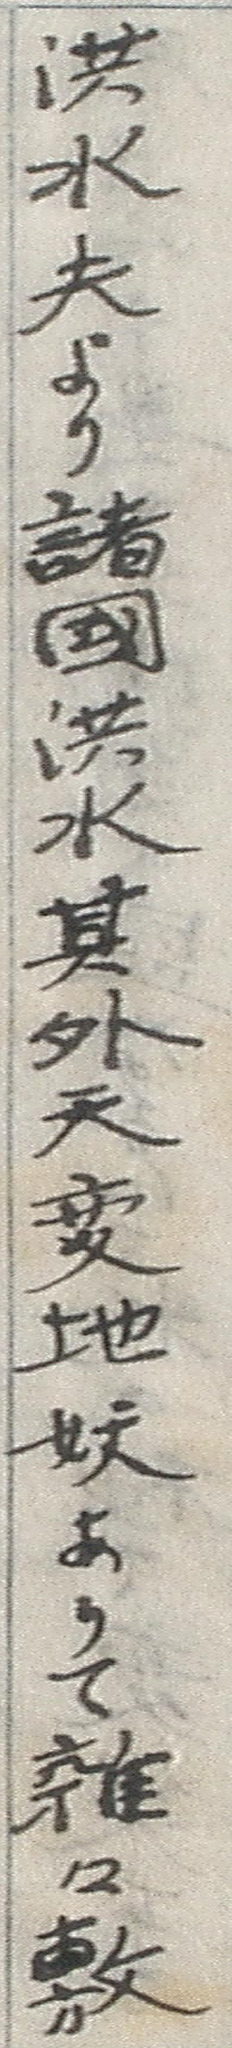洪水夫より諸国洪水其外天変地妖ありて雑々敷
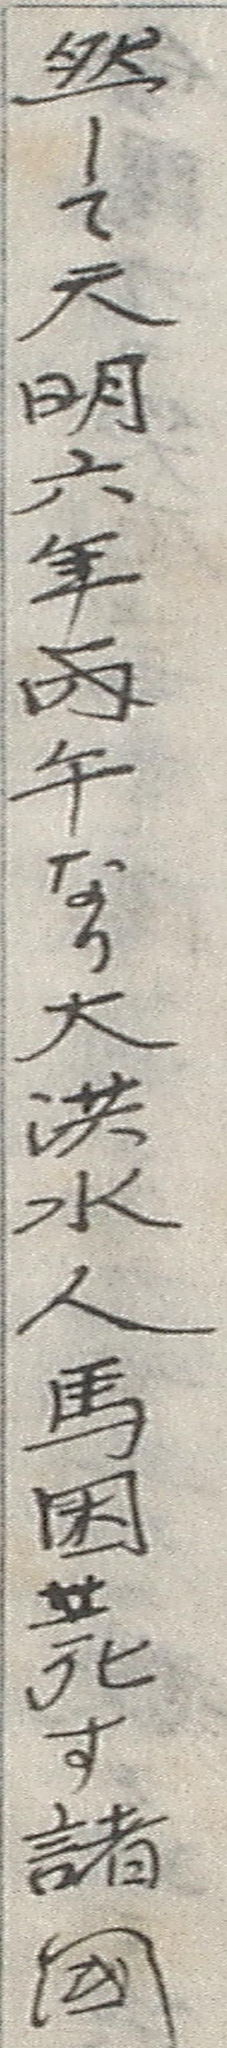然して天明六年丙午なり大洪水人馬困共死す諸国
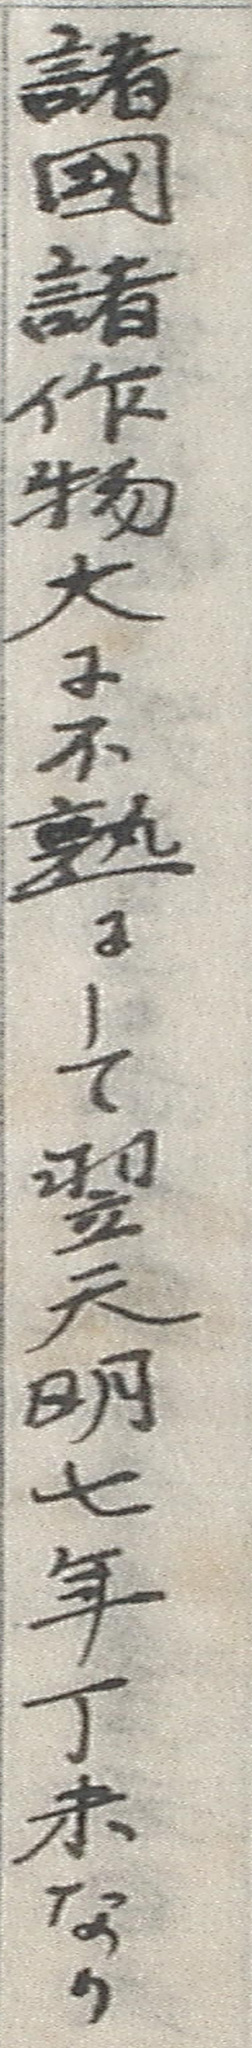諸国諸作物大に不熟にして翌天明七年丁未なり
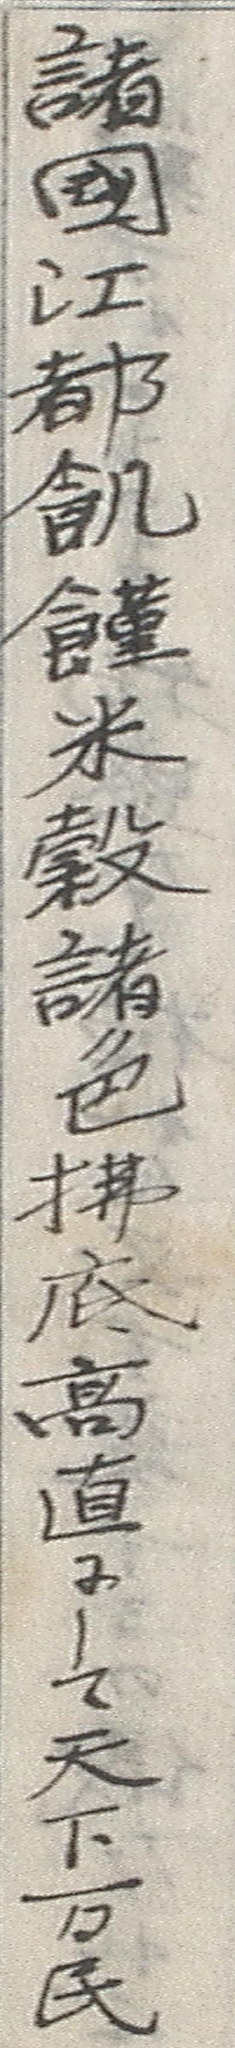諸国江都飢饉米穀諸色払底高直にして天下万民
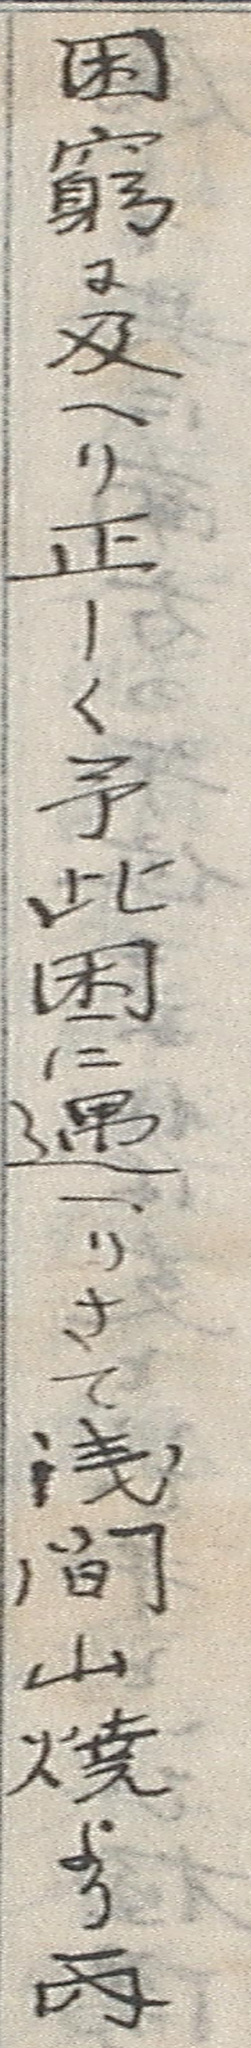困窮に及へり正しく予此困に遇へりさて浅間山焼より丙
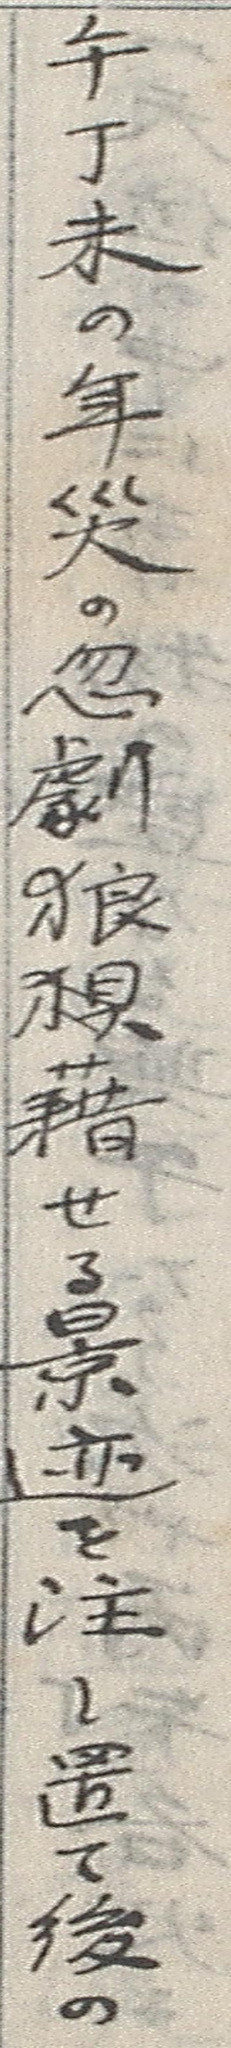午丁未の年災の忽劇狼狽藉せる景迹を注し置て後の
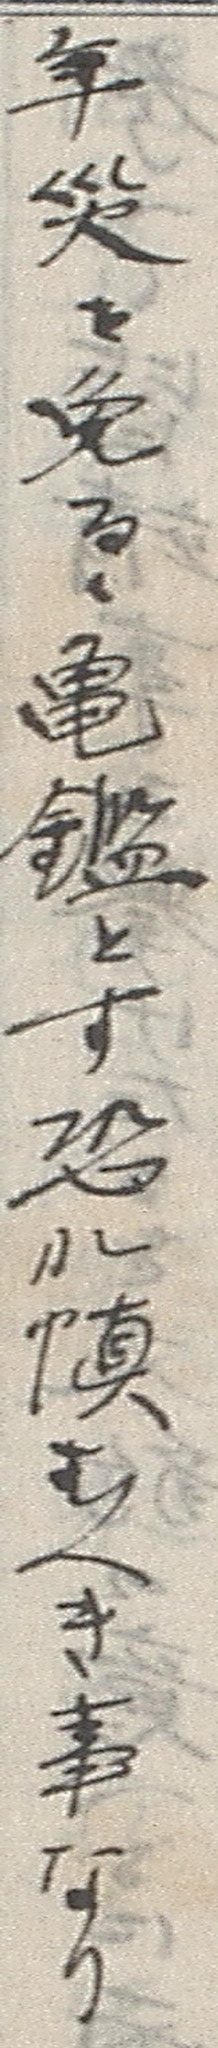年災を免るゝ亀鑑とす恐れ慎むへき事なり
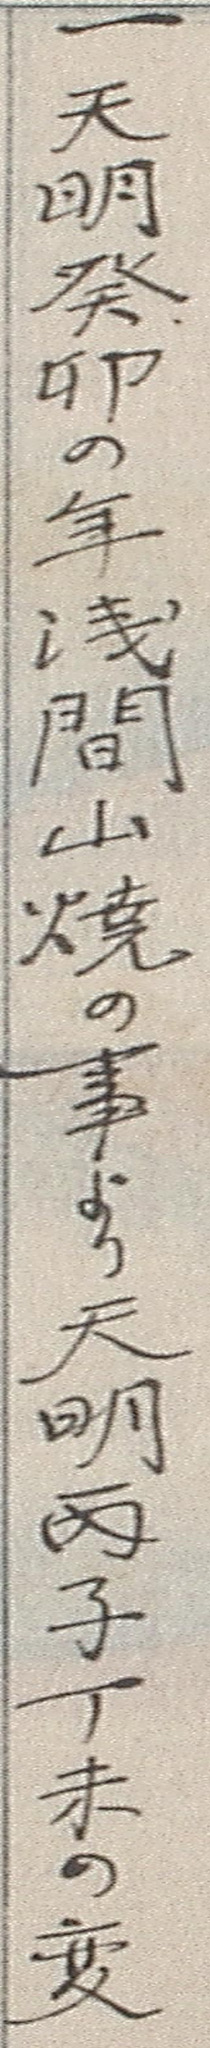一天明癸卯の年浅間山焼の事より天明丙子丁未の変
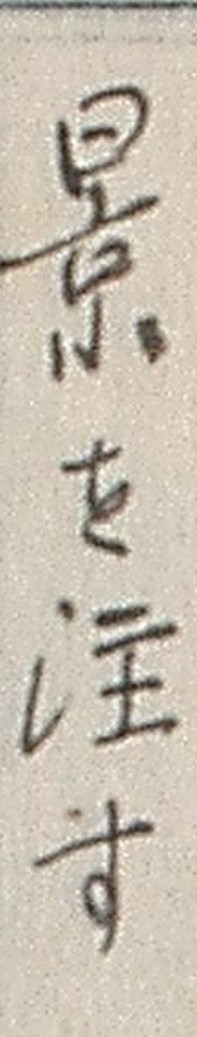景を注す
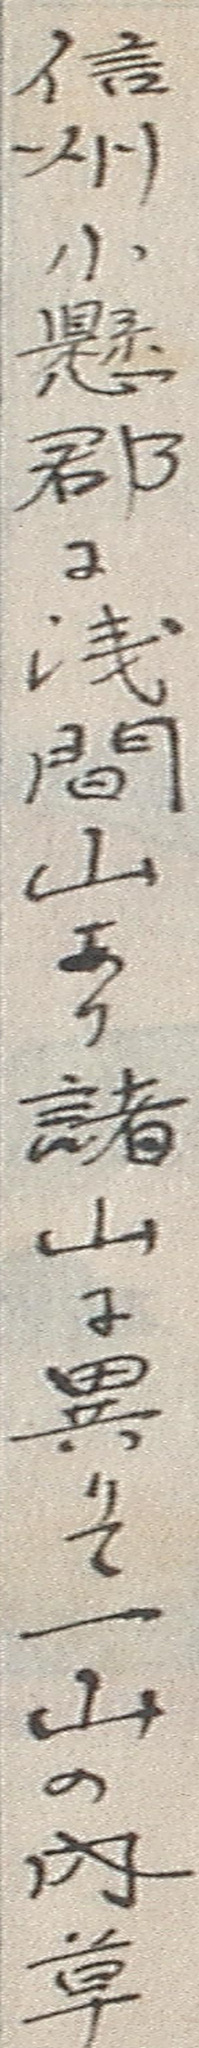信州小懸郡に浅間山あり諸山に異りて一山の内草
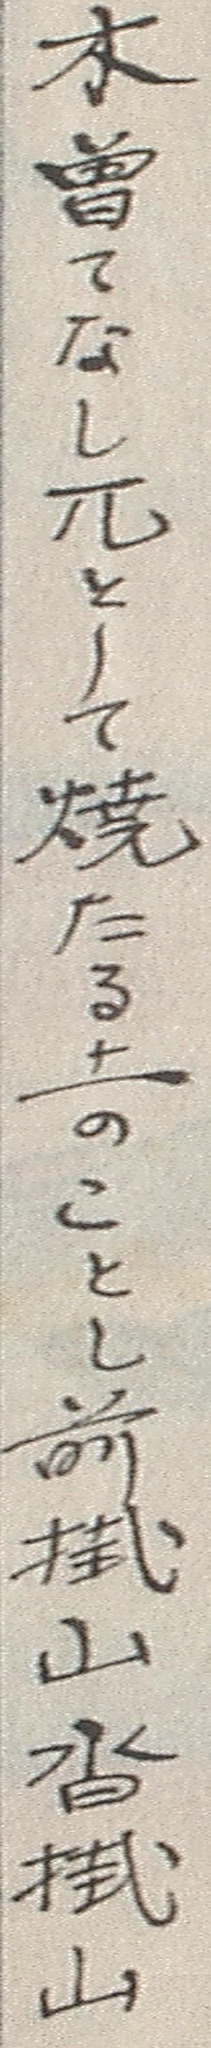木曽てなし兀として焼たる上のことし前掛山沓掛山

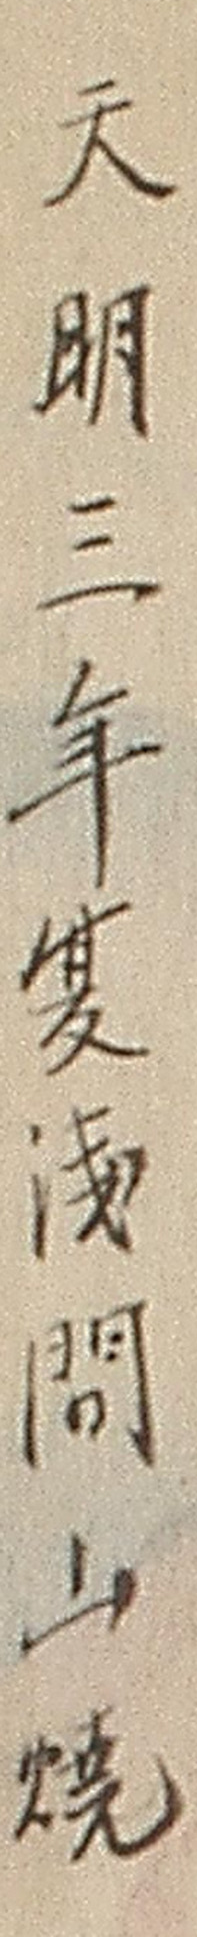天明三年夏浅間山焼
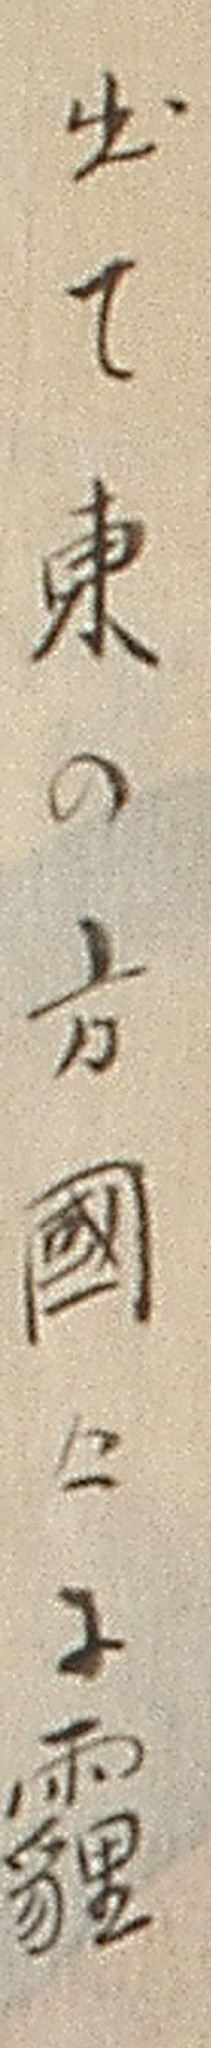出て東の方国々に霾

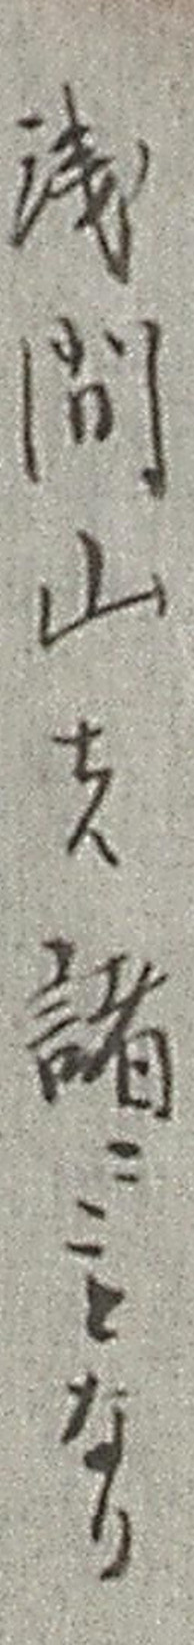浅間山者諸ニことなり
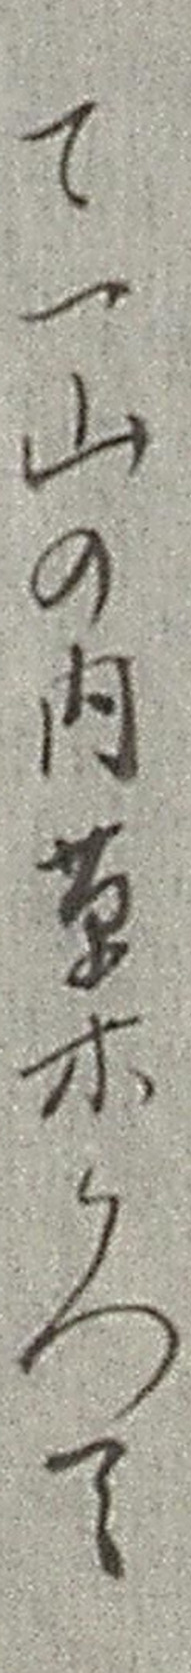て一山の内草等かつて
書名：浅間山焼出記
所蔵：東京大学地震研究所図書室 Earthquake Research Institute Library, The University of Tokyo, JAPAN
